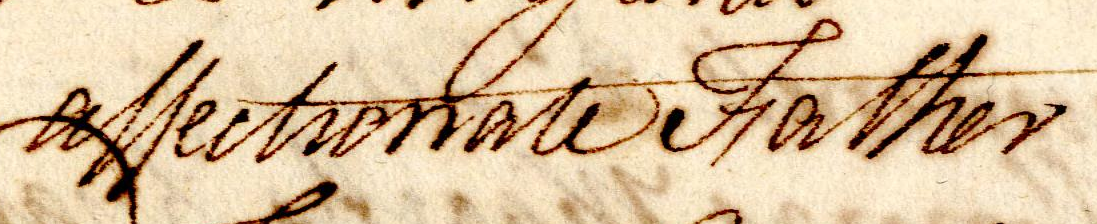affectionate Father
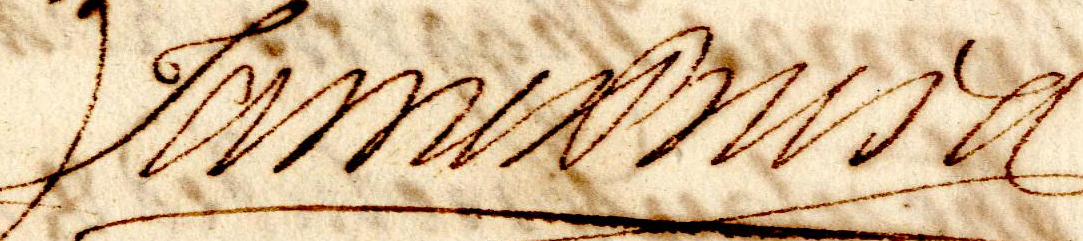James Burd
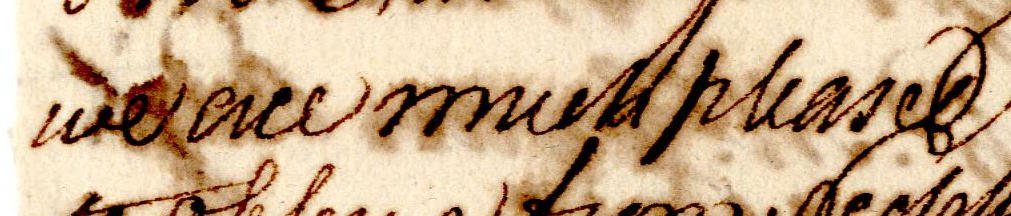we are much pleased
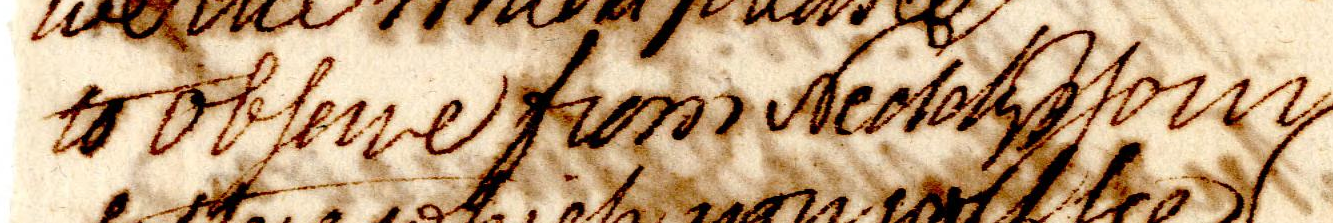to observe from Neddy your
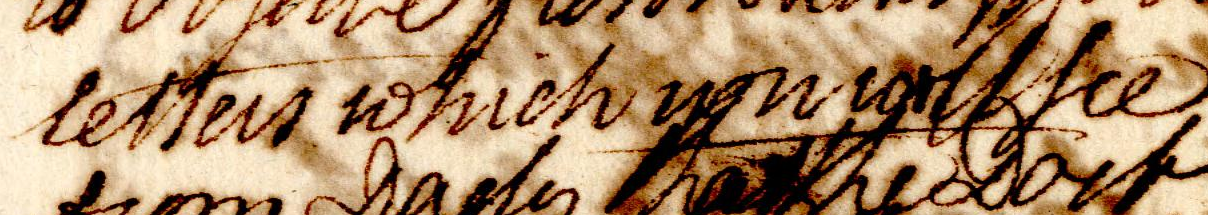letters which you will be
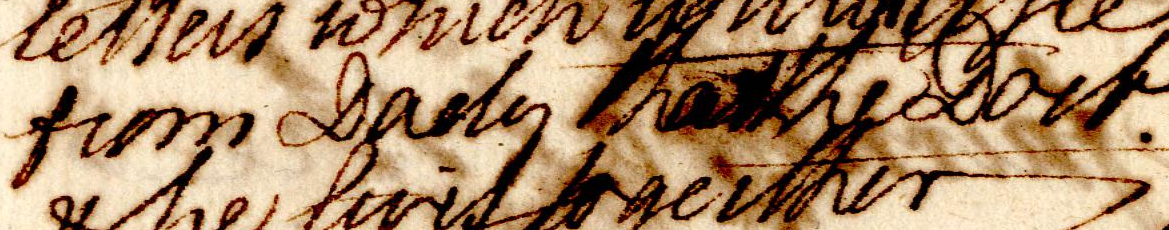from Dady that the Dour
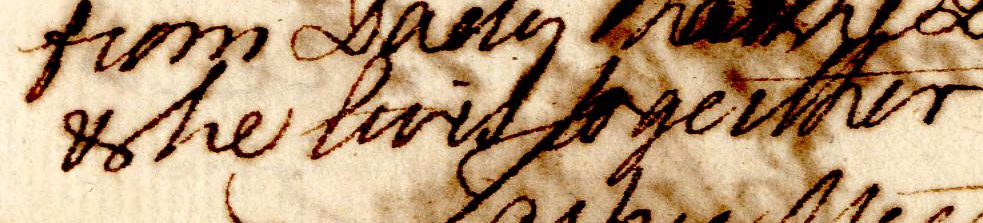& he lives together
